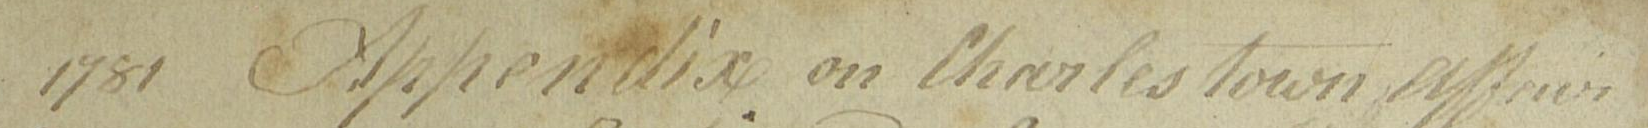1781 Appendix on Charlestown Affair
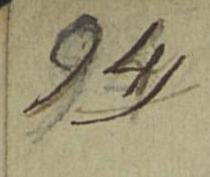94
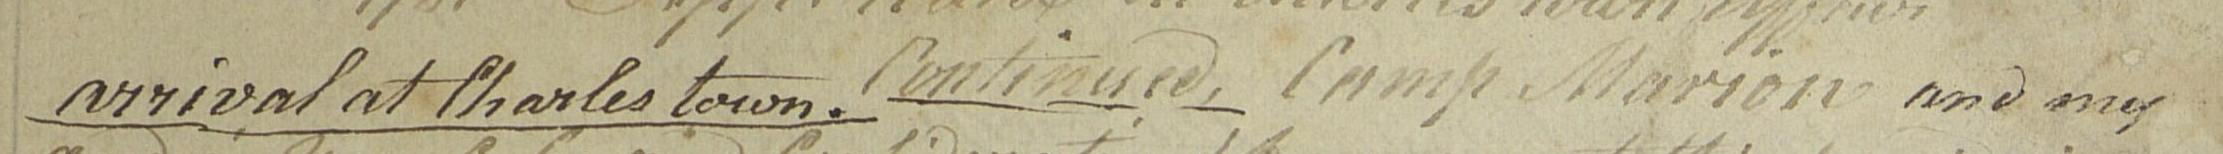arrival at Charles town. Continued, Camp Marion and my
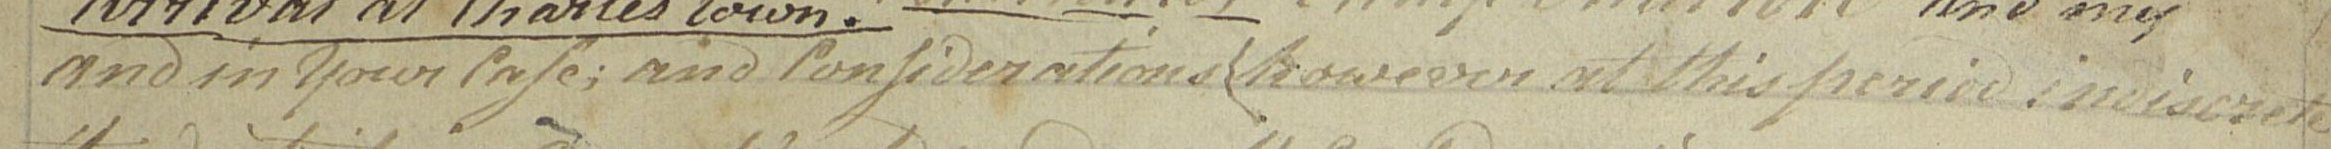and in Your Case; and Considerations (however at this period indiscrete
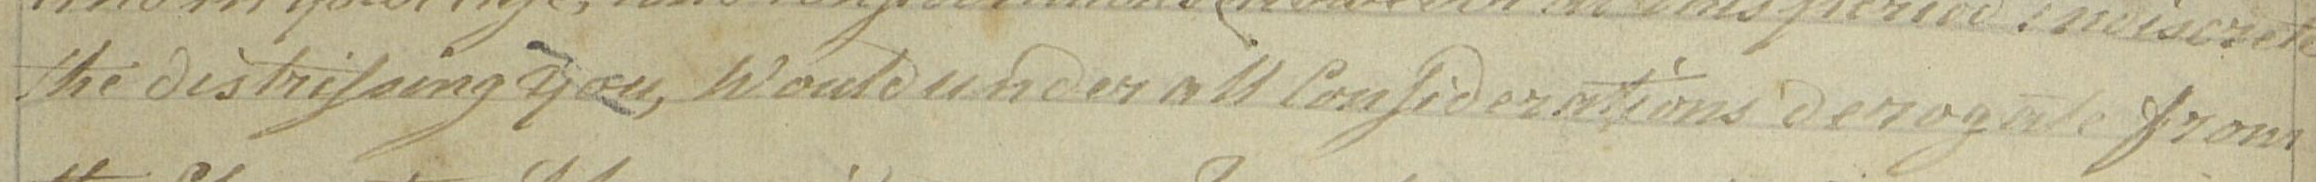the distrissing you, Would under all Considerations derogate from
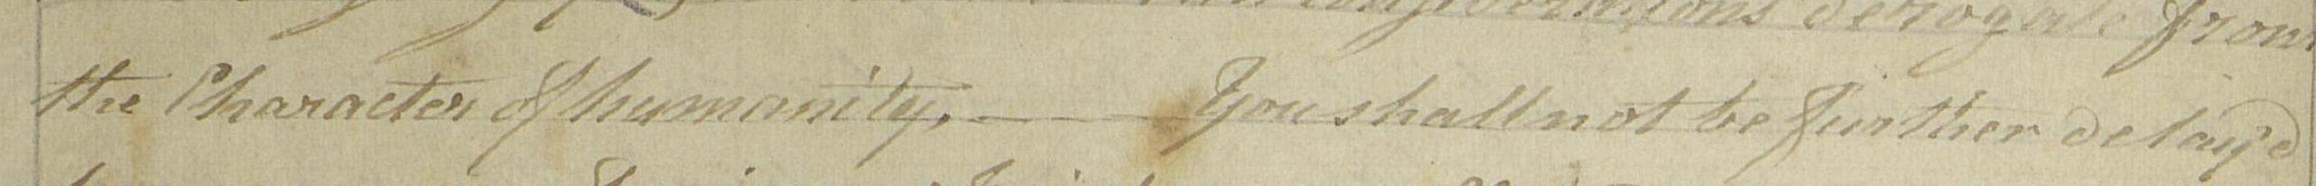the Character of humanity. You shall not be further delay'd
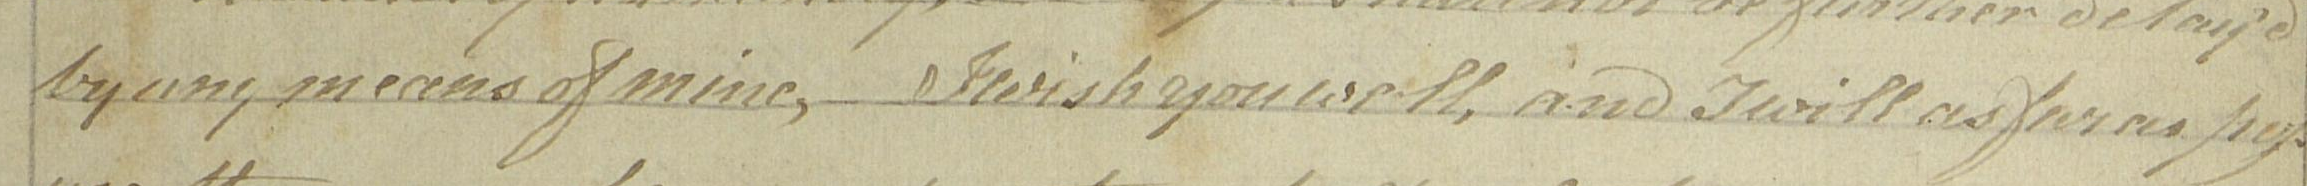by any means of mine, I wish you well, and I will as far as possible
